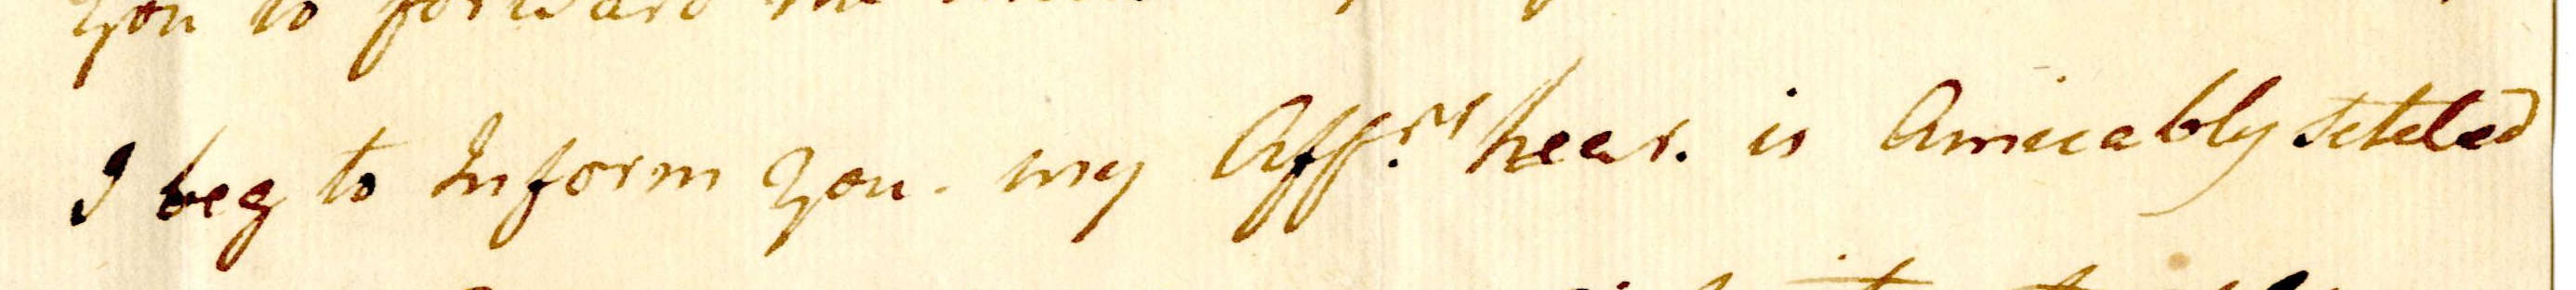I beg to Inform you my Aff^rs. hear. is Amicably seteled
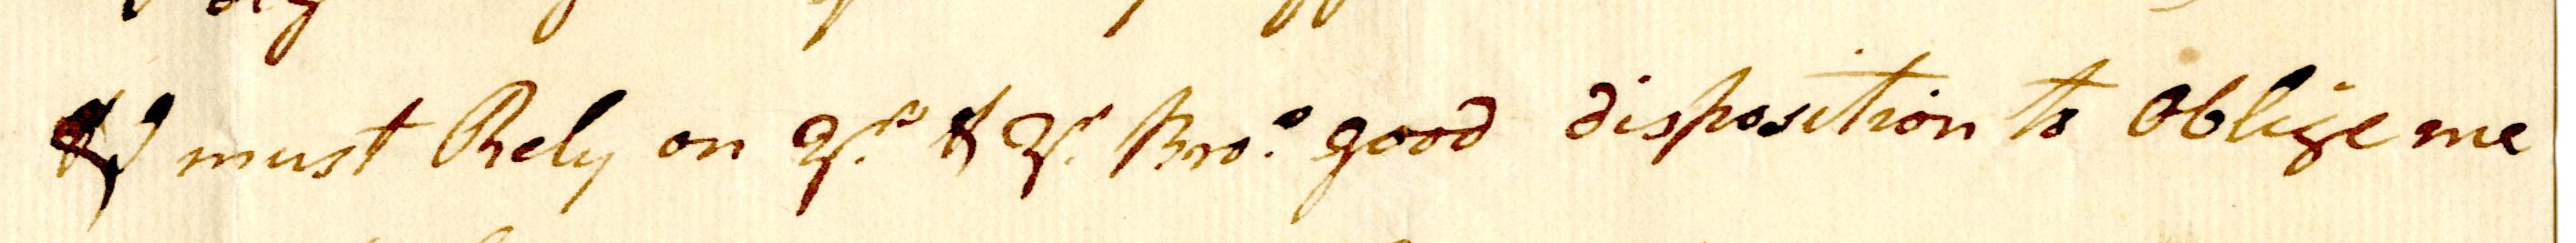& I must Rely on y^r. & y^r. Bro^s. good disposition to Oblige me
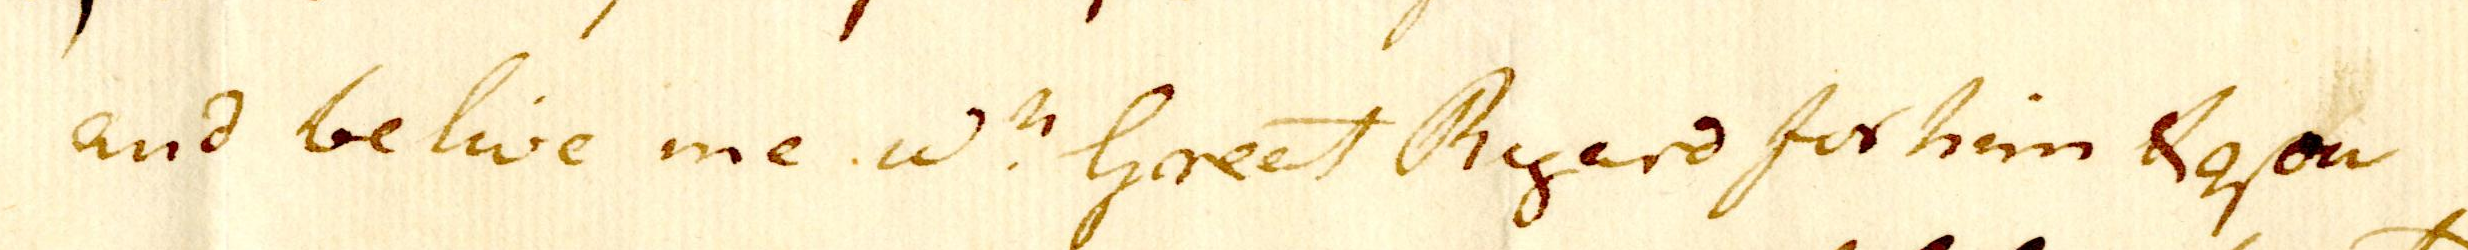and belive me w^th. Grreet Regard for him & you
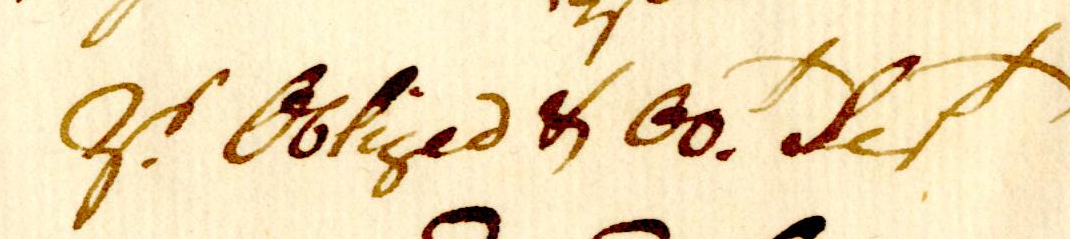Y^r. Oblived & oo^t. Ser^t
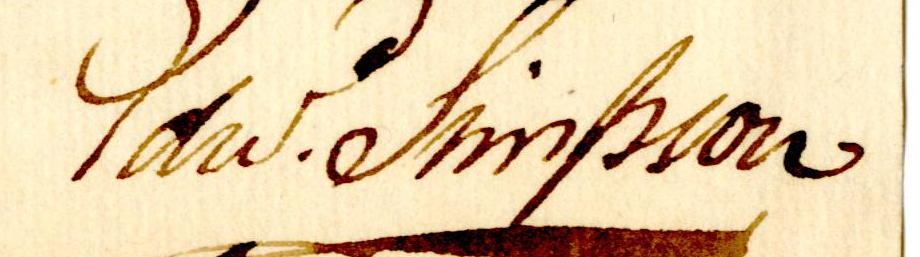Edw^d. Simpson
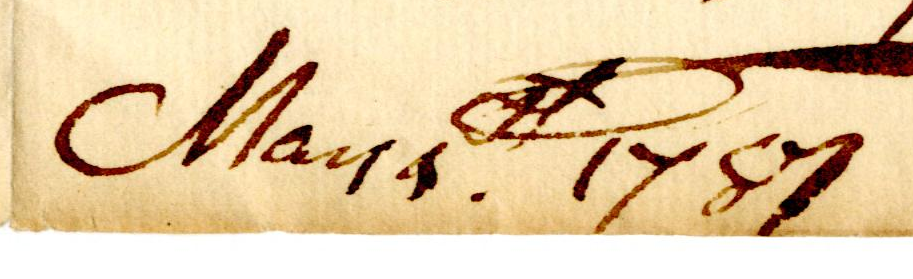May 1^st. 1781
